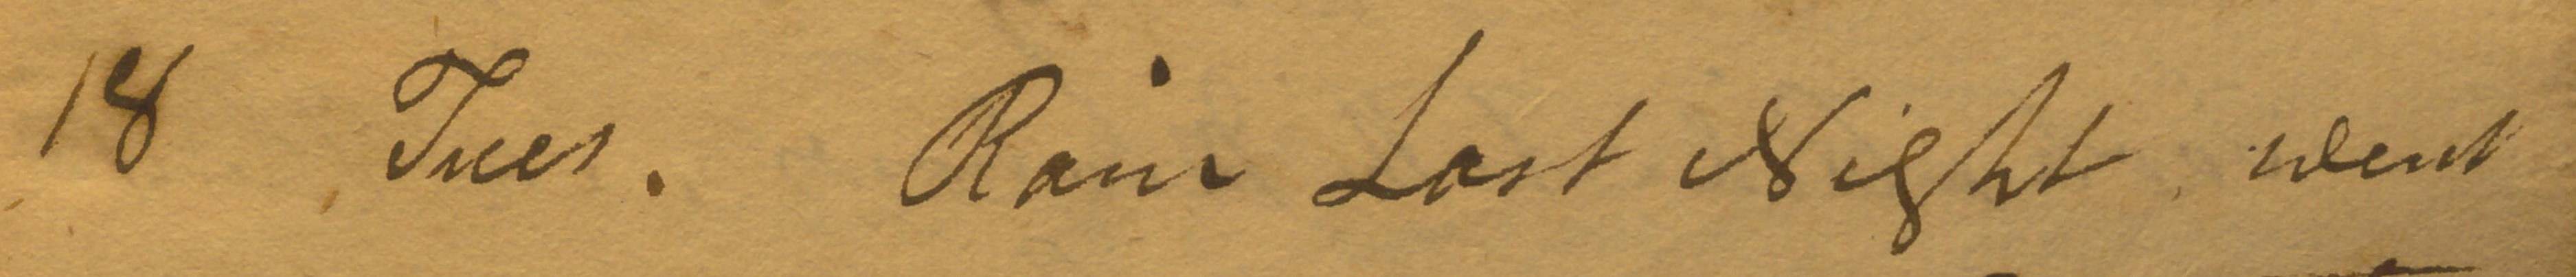18 Tues. Rain Last Night went
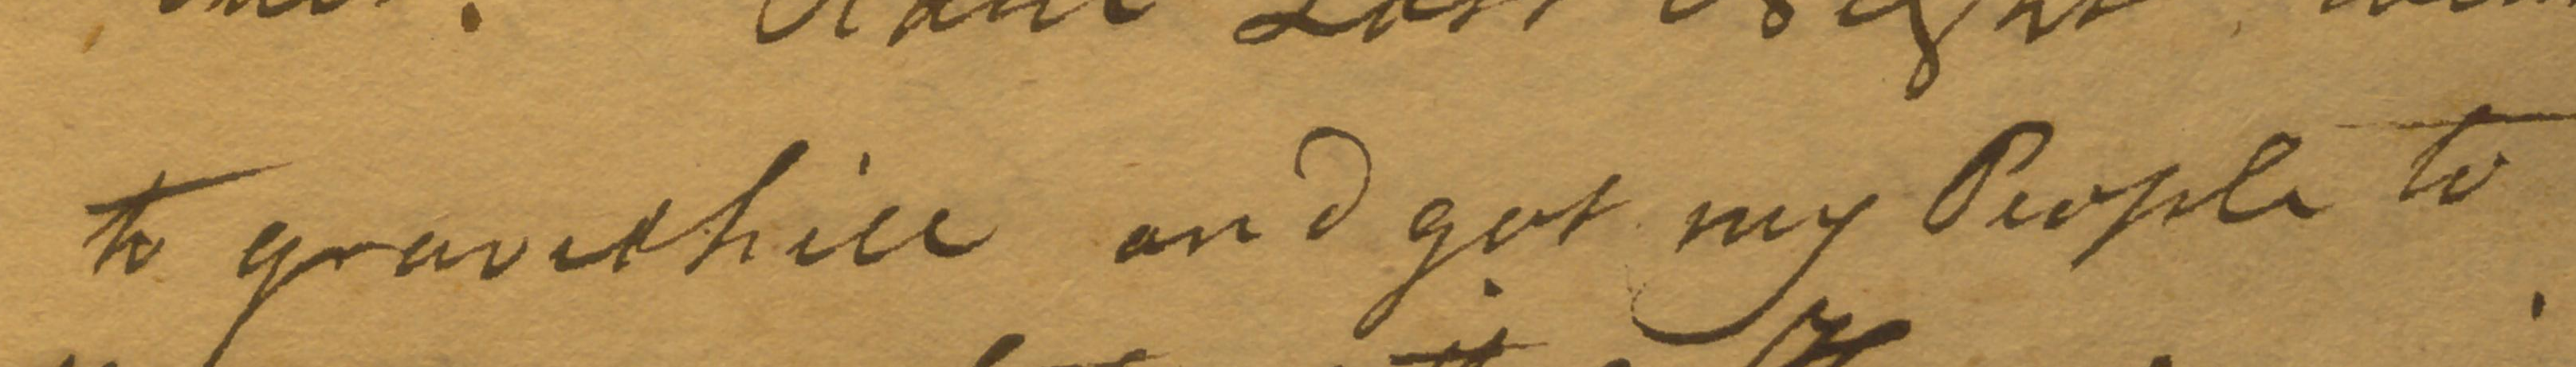to gravel hill and got my People to
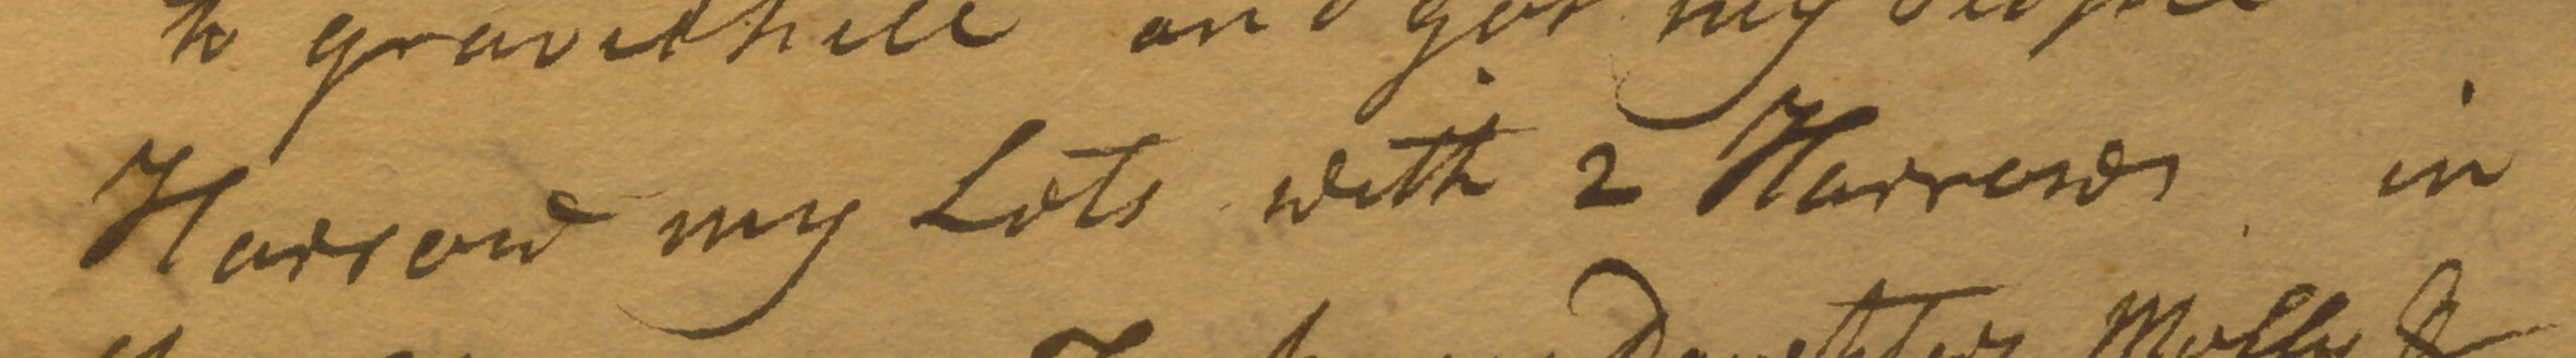Harrow my Lots with 2 Harrows in
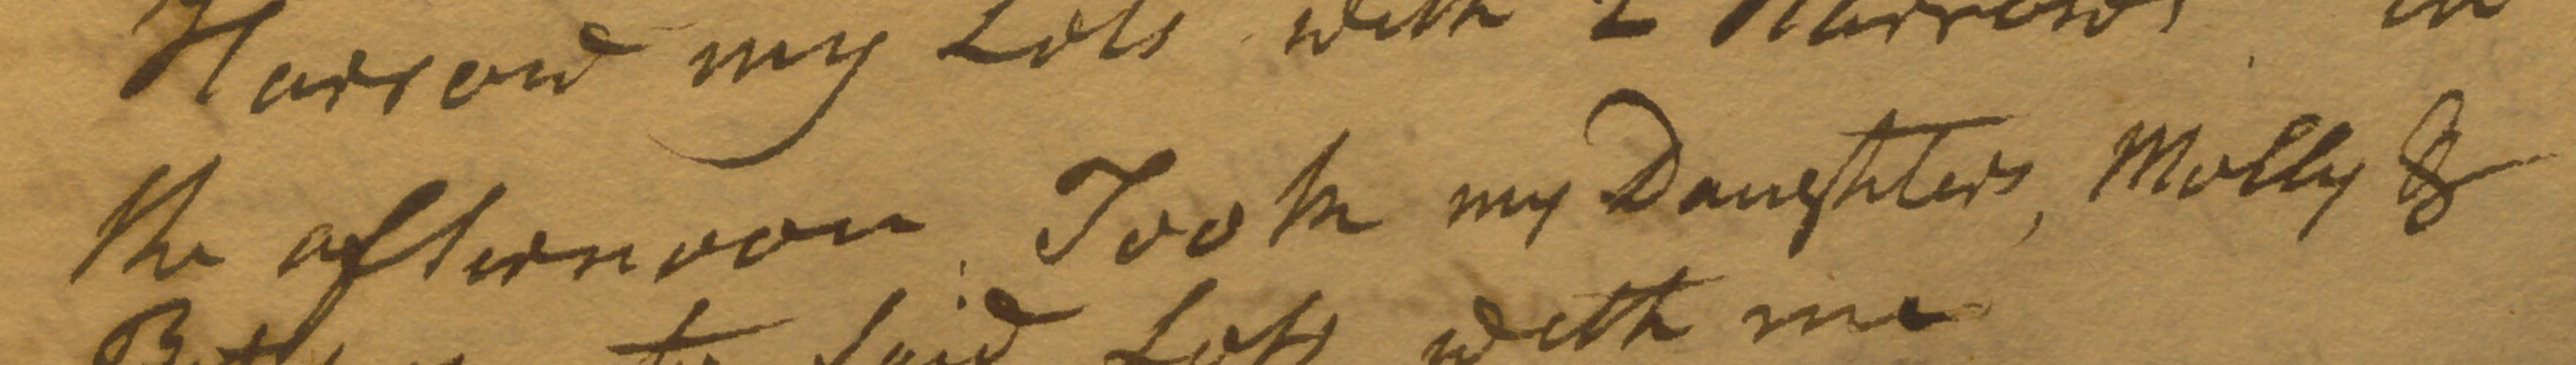the afternoon Took my Daughters, Molly &
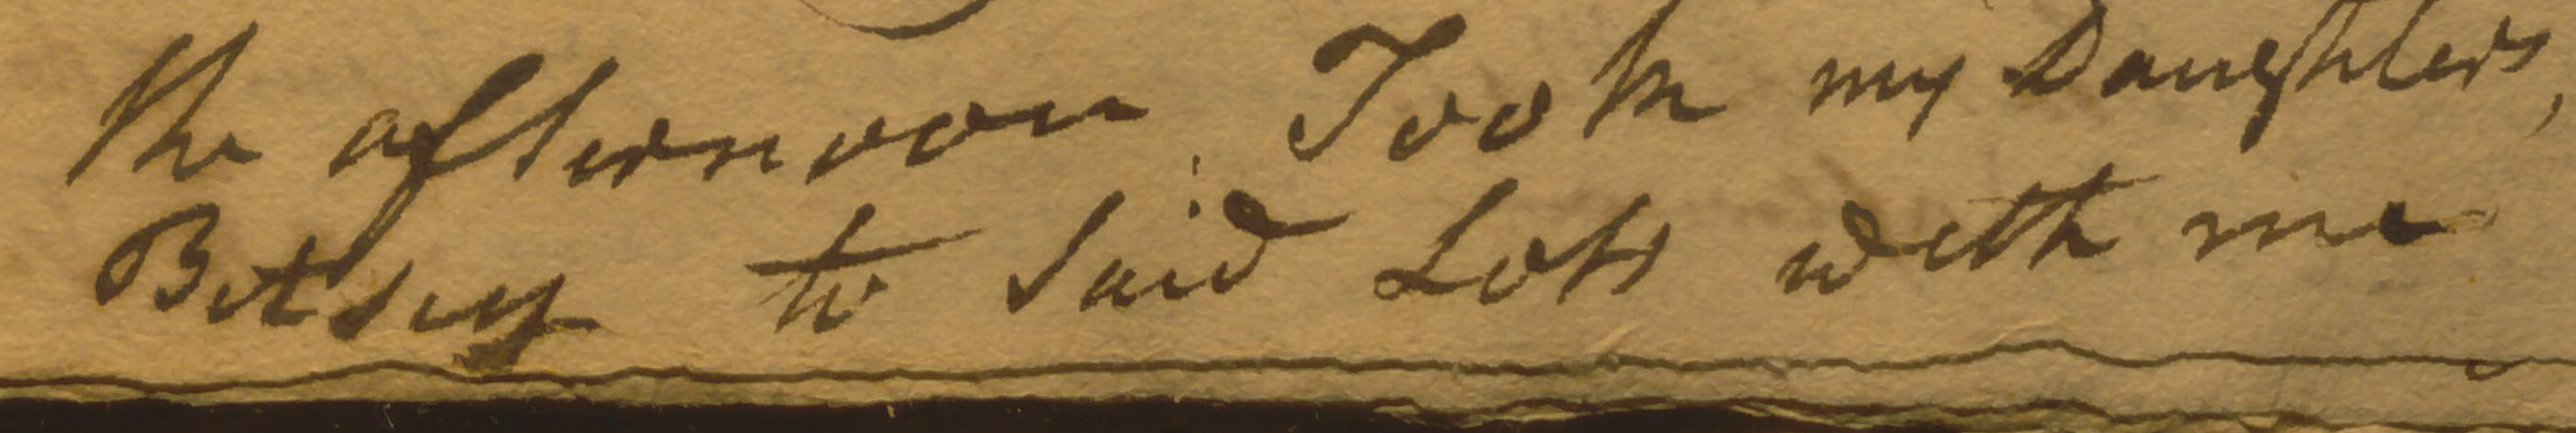Betsey to said Lots with me
